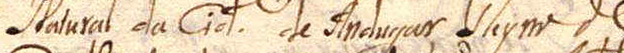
Natural da Cid̄.e de Andugar Reyno de
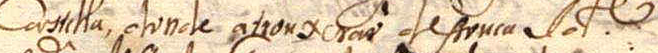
Castella, donde a trouxeraõ de pouca Id̄.e
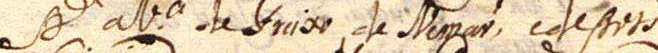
pa a V.a de Freixo de Nemaõ, e depois
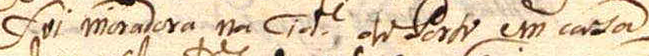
foi moradora na Cid̄.e do Porto em casa
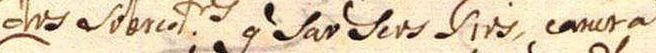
dos sobred̄.os q̄ saõ seos Tios, e auera
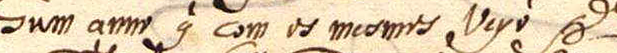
hum anno q̄ com os mesmos Veyo pa
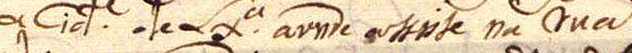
a Cid̄.e de Lxa. aonde assiste na rua
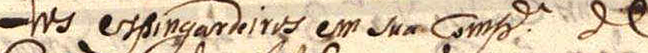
dos espingardeiros em sua Comp.a de
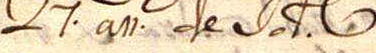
27. an. de Id̄.e
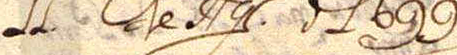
II. de Ag.o d̄ 1699.
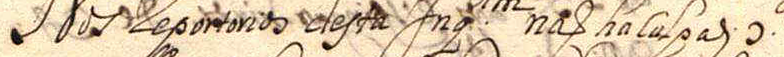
Nos Reportorios desta Jnq.am naõ ha culpas. ꝯ.a
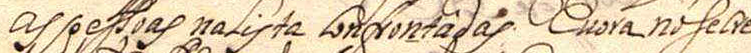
as pessoas na Lista Confrontadas. Euora no seCre
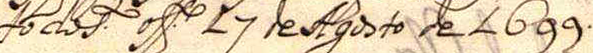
to do s.to off.o 17 de Agosto de 1699.
